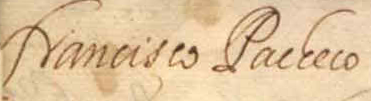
francisco Pacheco
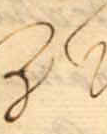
33
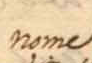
nome
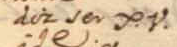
diz ser xv.
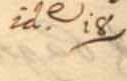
id.e i.8
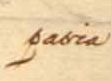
patria
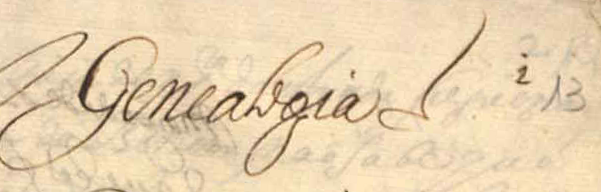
Genealogia
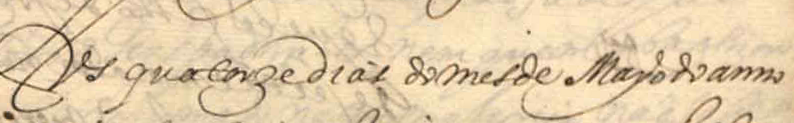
Os quatorze dias do mes de Mayo do anno
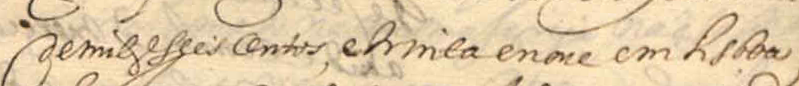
de mil e seiscentos, e trinta e noue em Lisboa
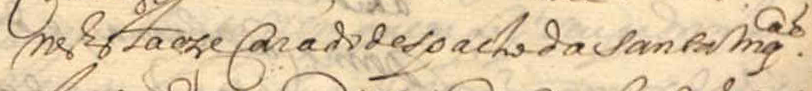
nos Estaos, e Caza do despacho da Santa Inq.çaõ
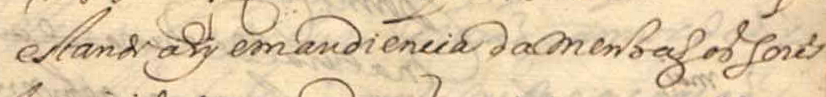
estando ahy em audiencia da menha hos Sores
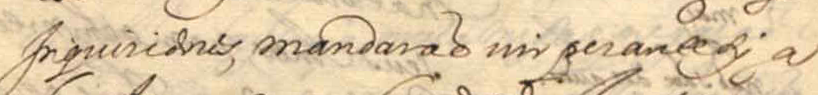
Jnquizidores, mandaraõ uir perante sy a
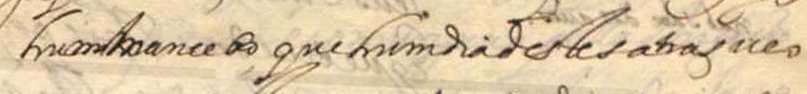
hum mancebo que hum dia destes atras ueo
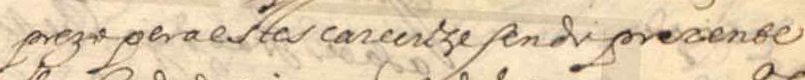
prezo pera estes carceres e sendo prezente
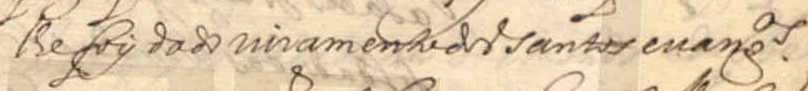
lhe foy dado uiramento dos santos euang.os
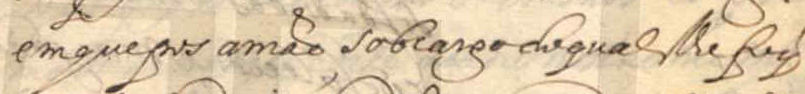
em que pos a maõ, sob cargo do qual lhe foy
